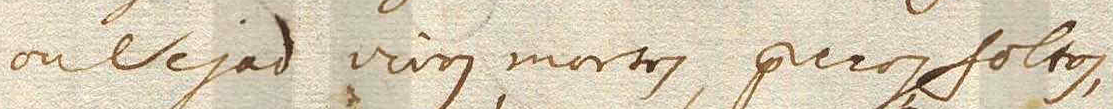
ou sejaõ vivas, mortas, prezas, soltas,
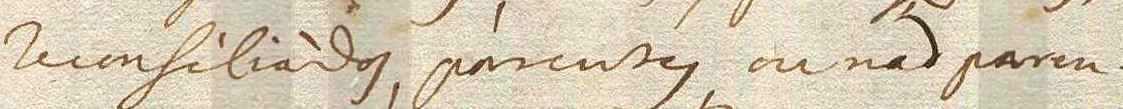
Reconsiliàdas, parentes, ou naõ paren
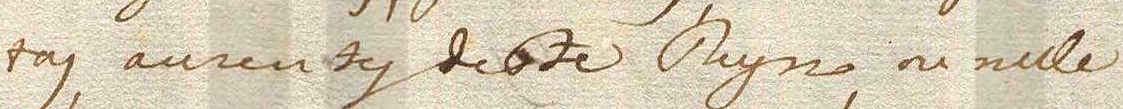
tas, auzentes deste Reyno, ou nelle
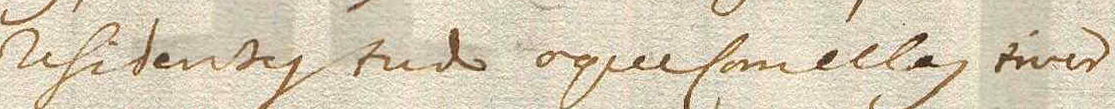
Residentes tudo o que Com ellas tiver
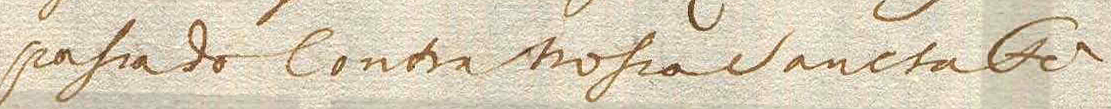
passado contra nossa sancta Fé
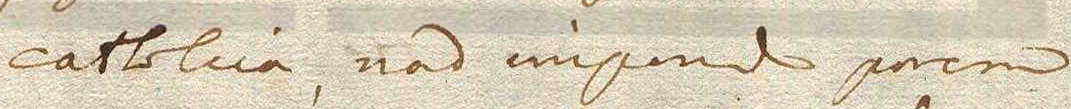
catholica, naõ impondo porem
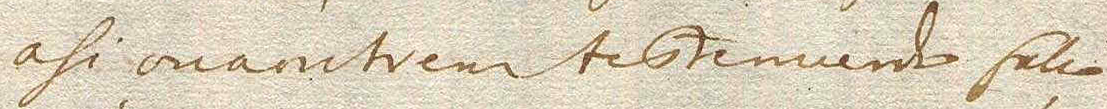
a si ou a outrem testemunho falço
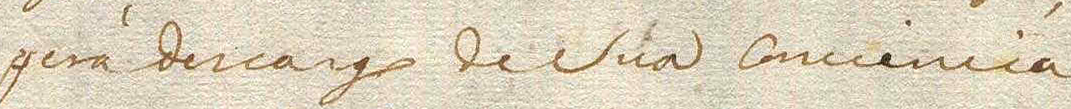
pera descargo de sua conciencia
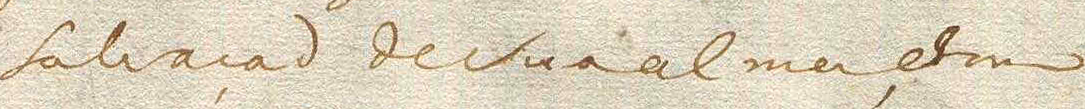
salvaçaõ de sua alma, e bon
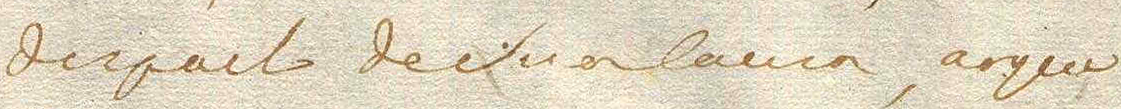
despacho de sua cauza, ao que
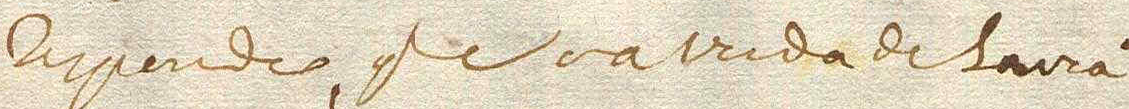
Respondeo, q̄ so a verdade havia
